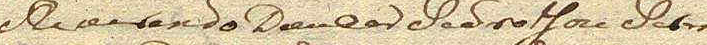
Reverendo Doutor Pedro Joze Perei
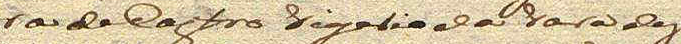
ra de Castro Vigario da Vara des
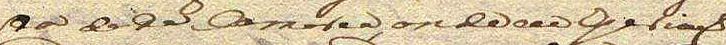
ta dita Comarca, onde eu o escrivaꝭ
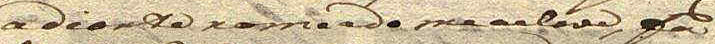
a diante nomeado me achava, sen
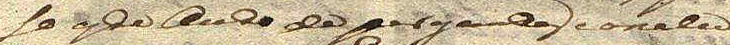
do este auto de perguntas e ___
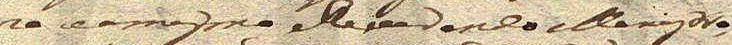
zo e o mesmo Reverendo Menistro,
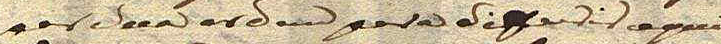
por sua ordem para diferir o que
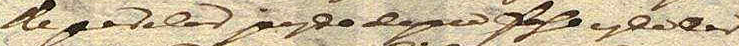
lhe perecer posto deposese este ter
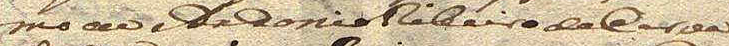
mo ou Antonio Ribeiro de Carva
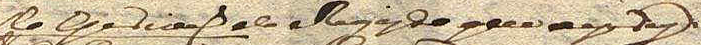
lho o escrivaꝭ de Registo que
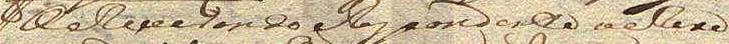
de Reverendo Respondente o Reve
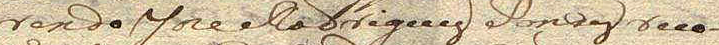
rendo Joze Rodrigues Santos reco
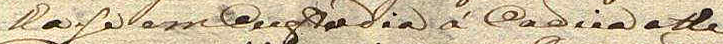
lhase em o cesto dia á Cadeia athe
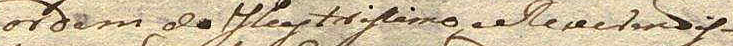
ordem do Jlustrissimo, e Reverendis
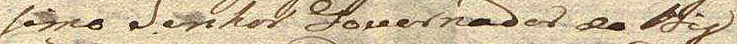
simo senhor Gouernador do Bis
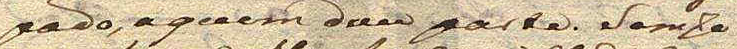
pado, a quem dou[?] parte. Sam Jo
